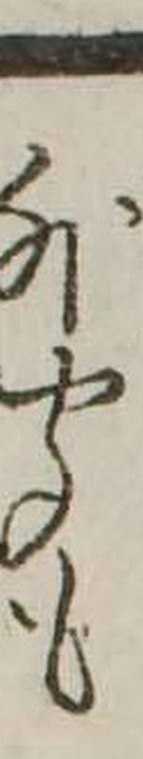外聞も
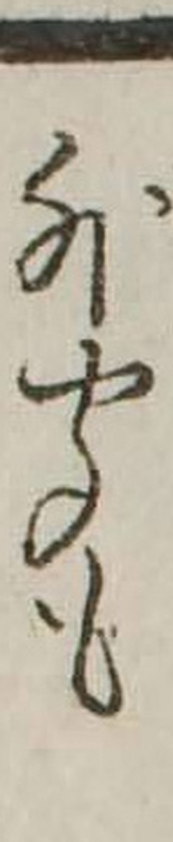外聞も
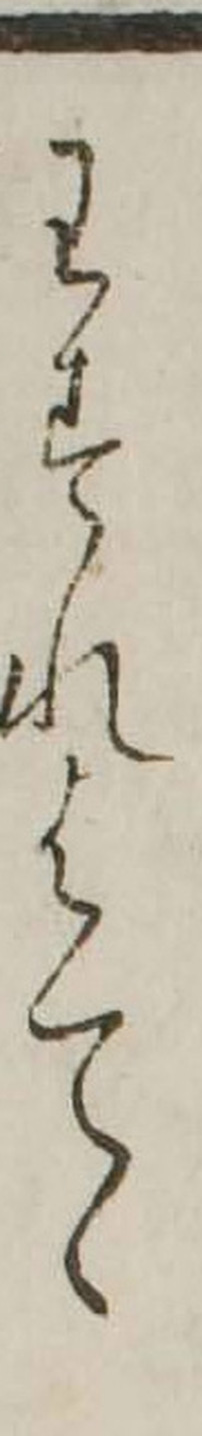わすれはてゝ
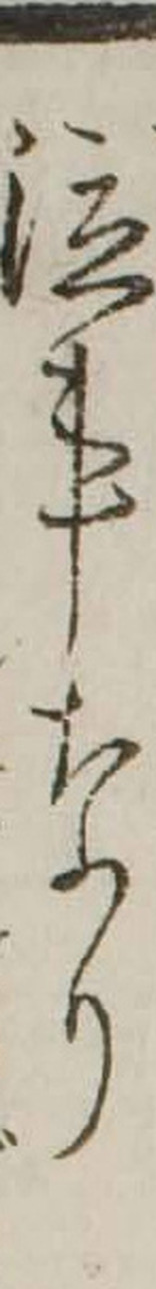泣事なり
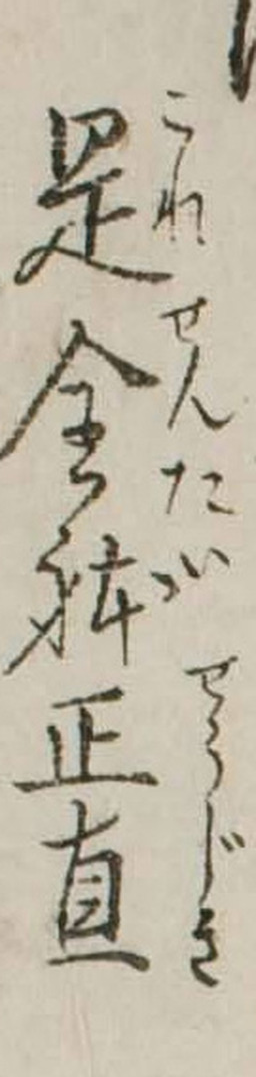是全体正直
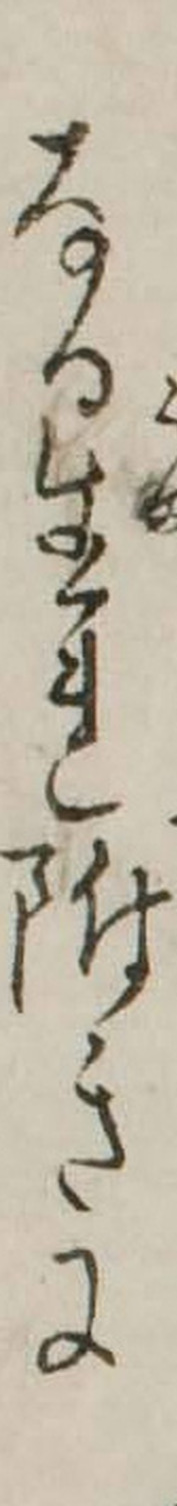なる生れ附きに
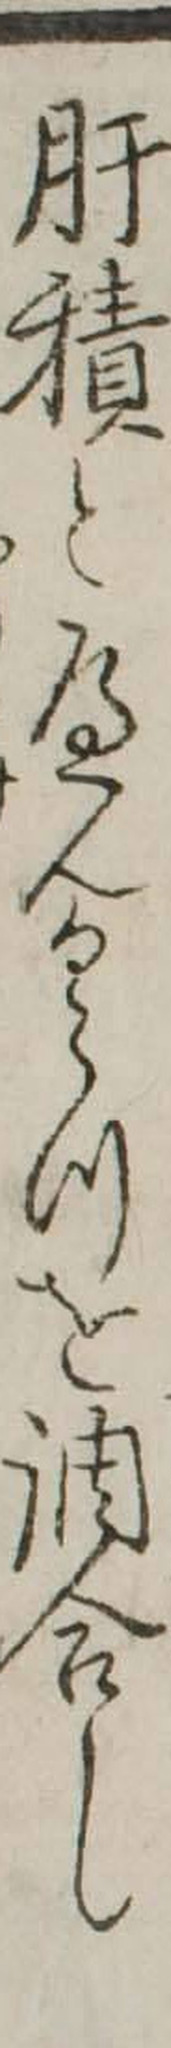肝積とへんくつを調合し
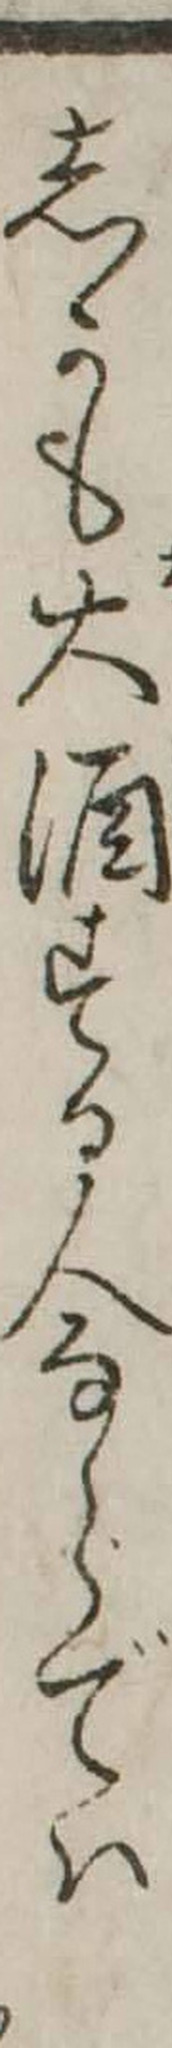しかも大酒する人ならでは
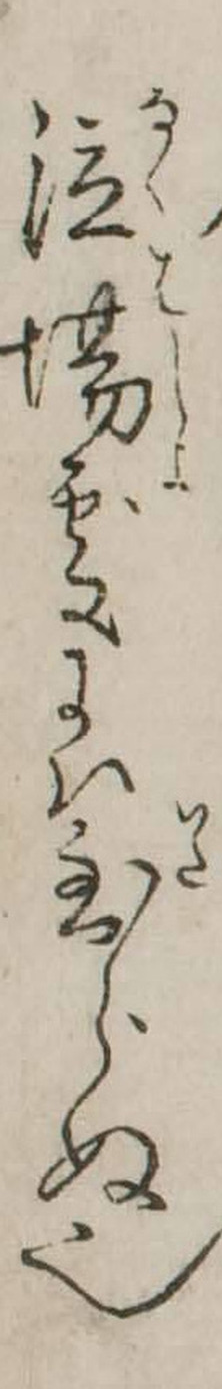泣場処には至らぬ也

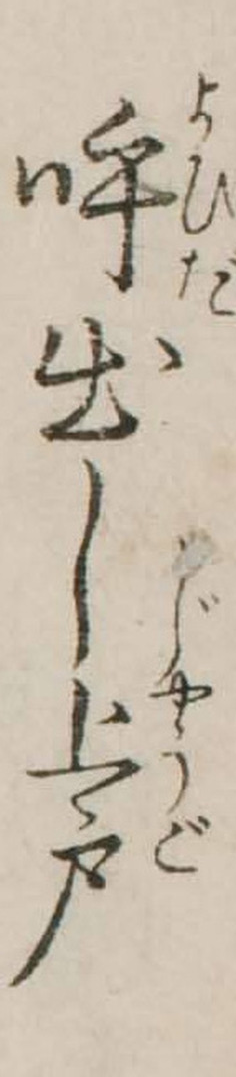呼出し上戸
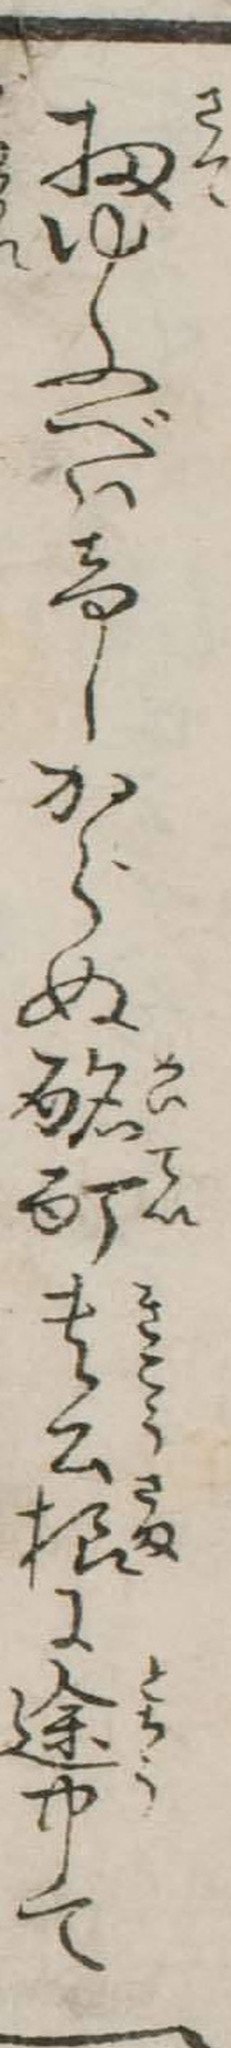扨ゆふべはけしからぬ酩酊貴公様に途中て
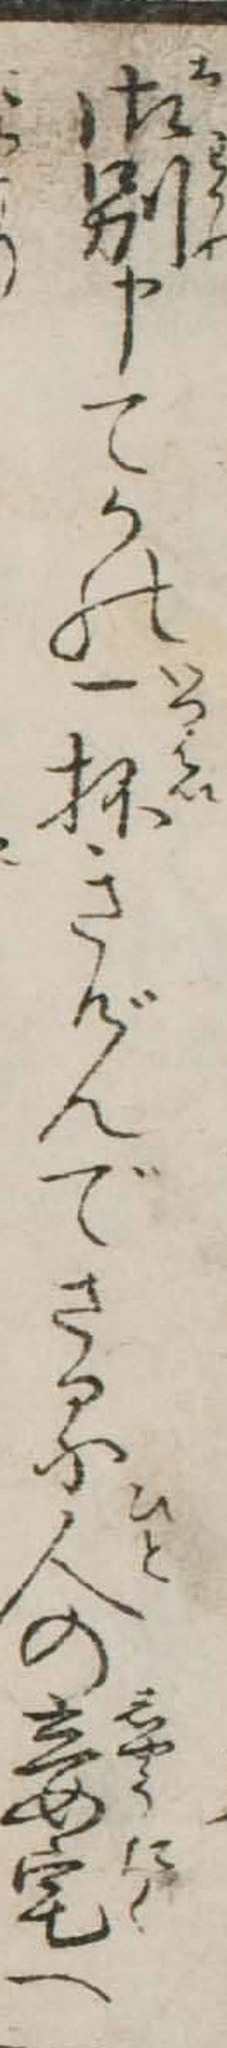御別申てかの一杯きげんでさる人の妾宅へ
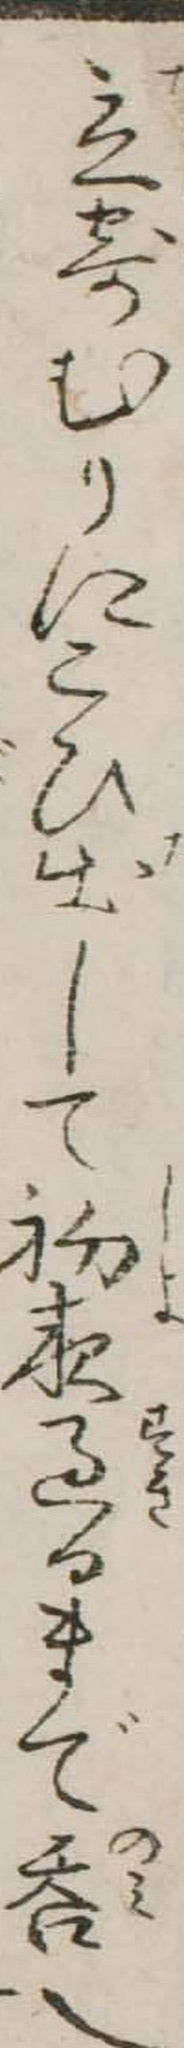立寄むりにこひ出して初夜過るまで吞
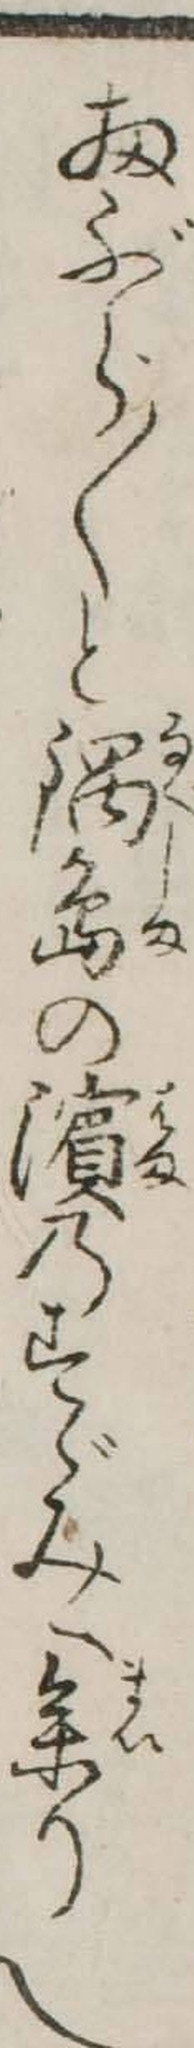扨ぶら〳〵と鍋島の浜のすゞみへ参り
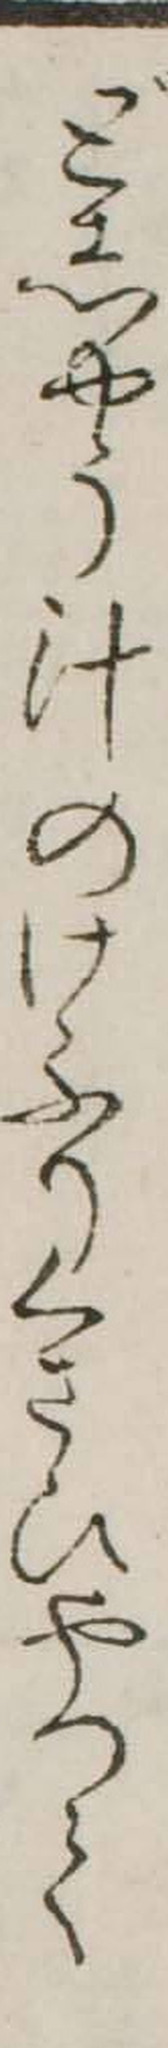どしやう汁のけふりくさひやつて
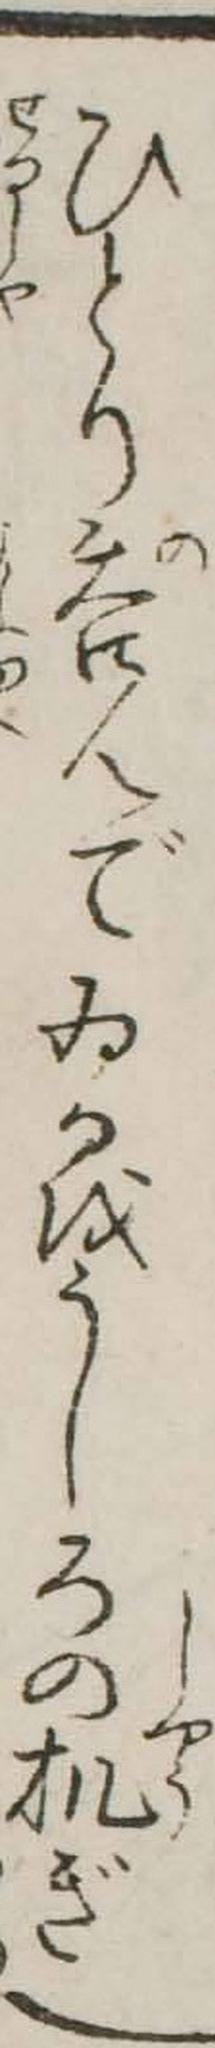ひとり吞んでゐるをうしろの机ぎから
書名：繪本不盡泉
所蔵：国文学研究資料館
